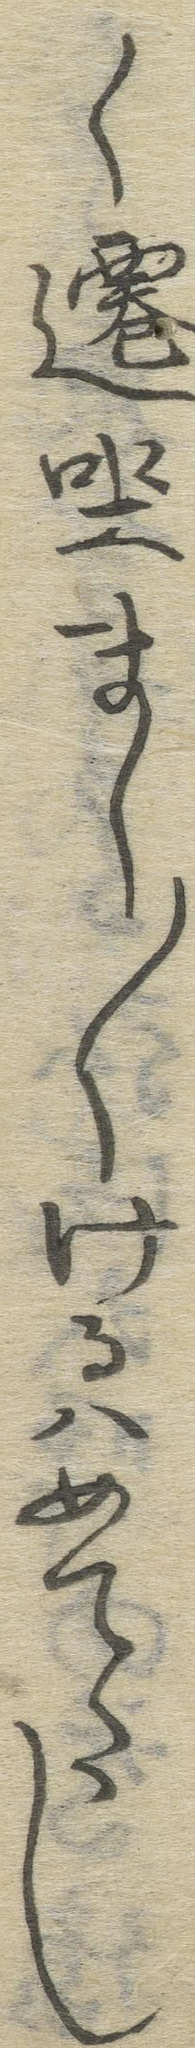〳〵遷座まし〳〵けるはめてたし

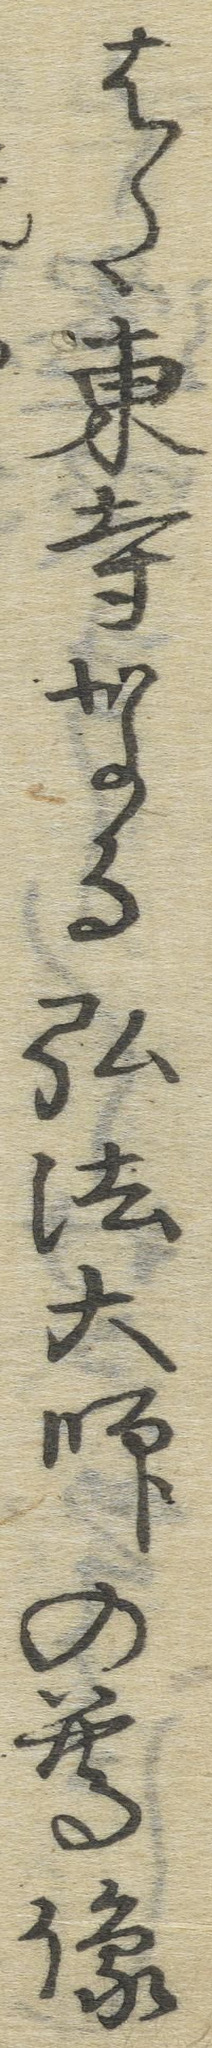はた東寺なる弘法大師の尊像
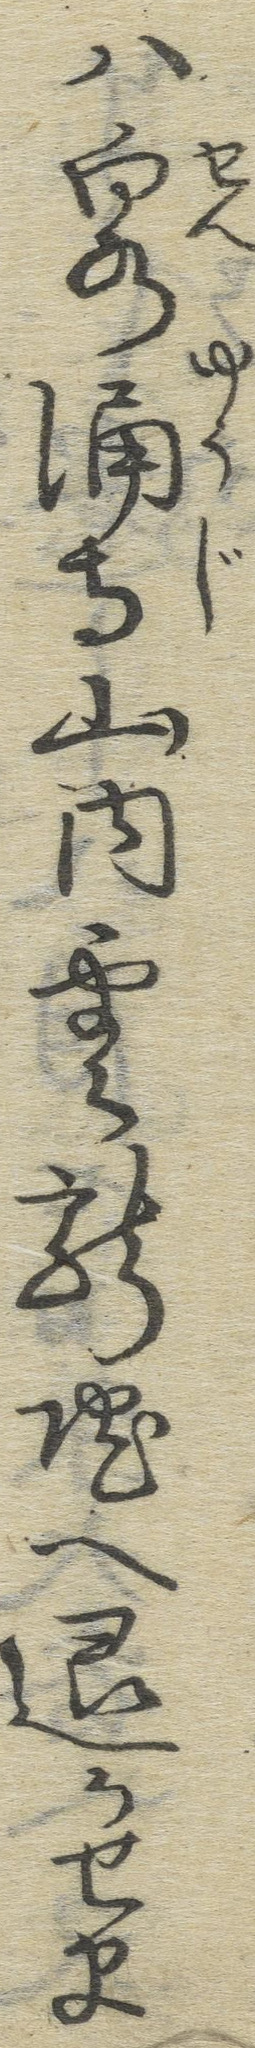は泉涌寺山内雲龍院へ退かせま
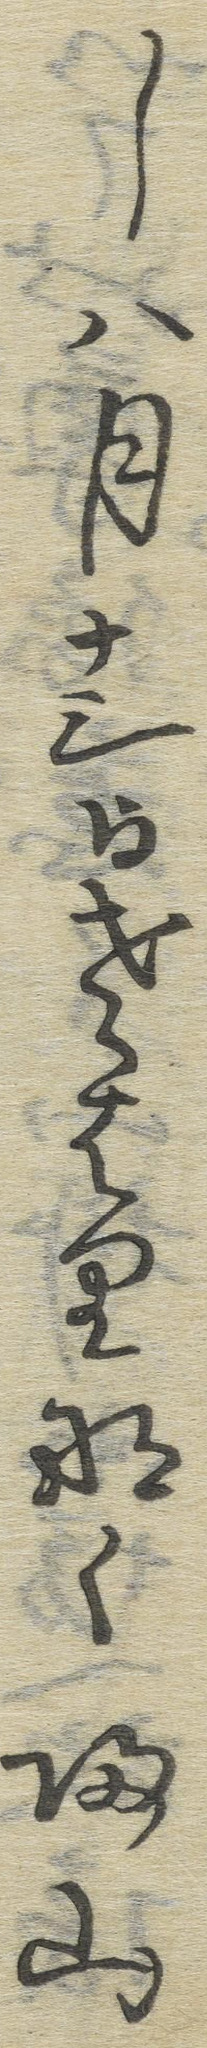し八月十三日さはりなく帰山
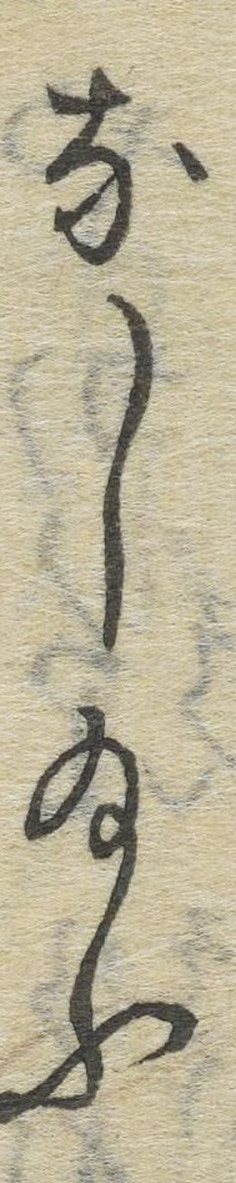なし給ふ
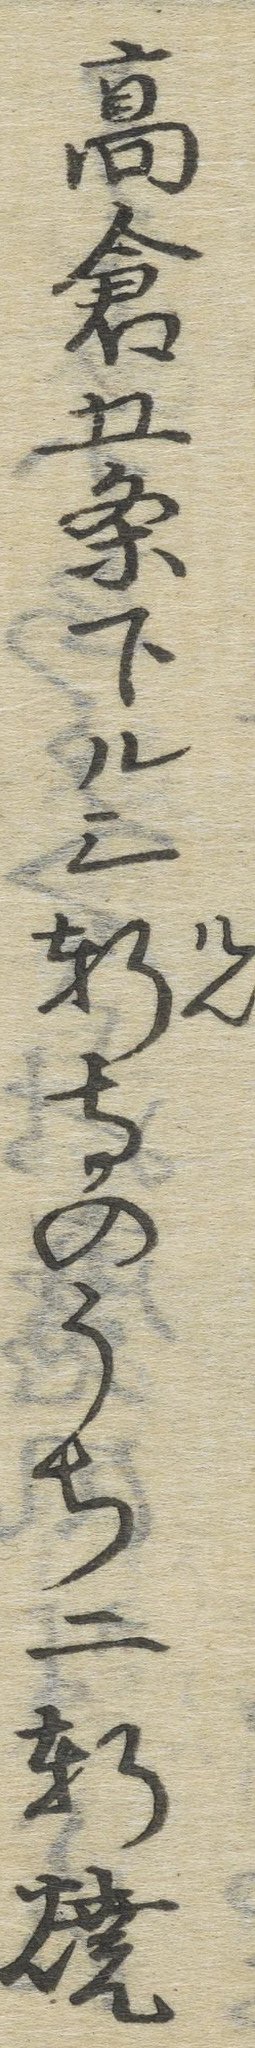高倉五条下ル三軒寺のうち二軒焼
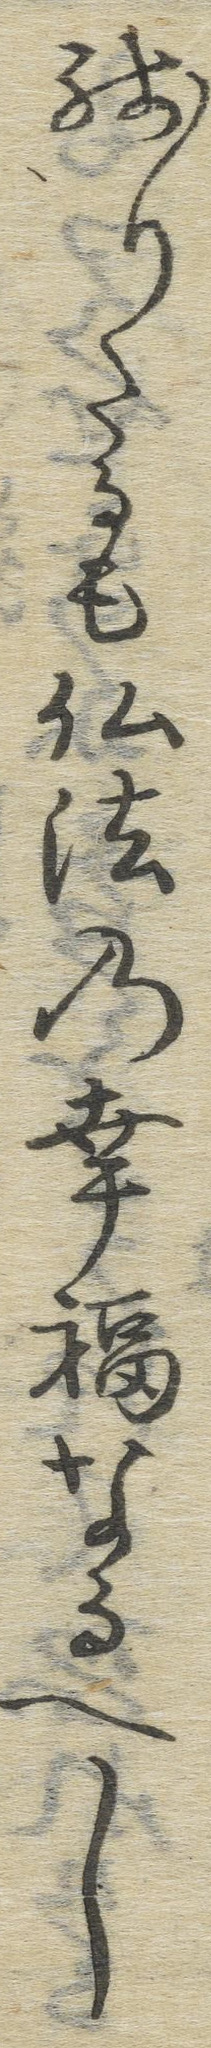残りたるも仏法の幸福なるへし
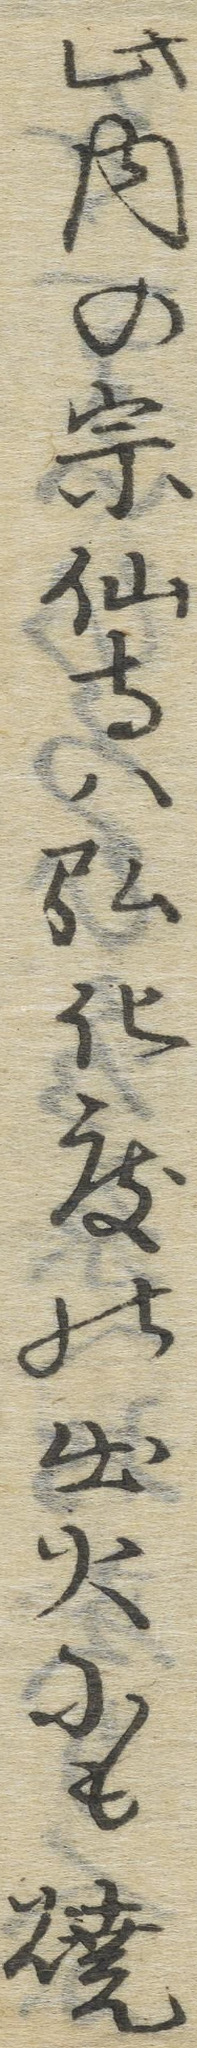此内の宗仙寺は弘化度の出火にも焼
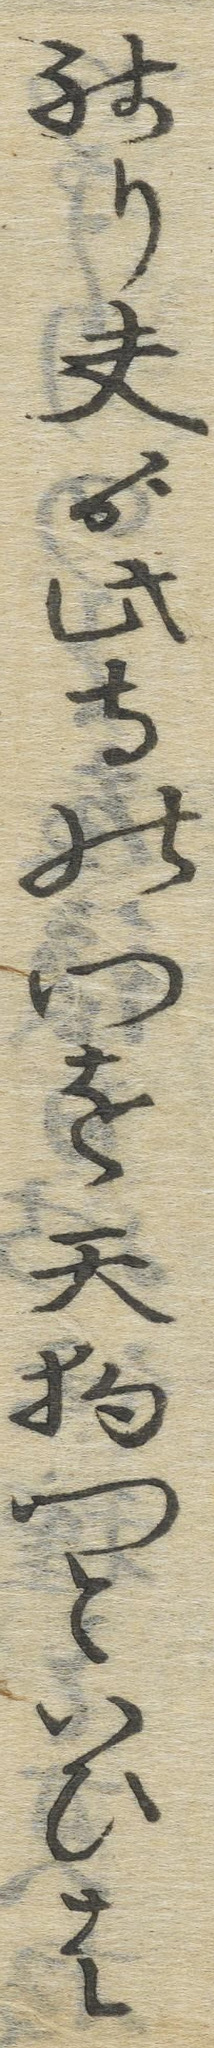残り夫ゟ此寺の門を天狗門といひは
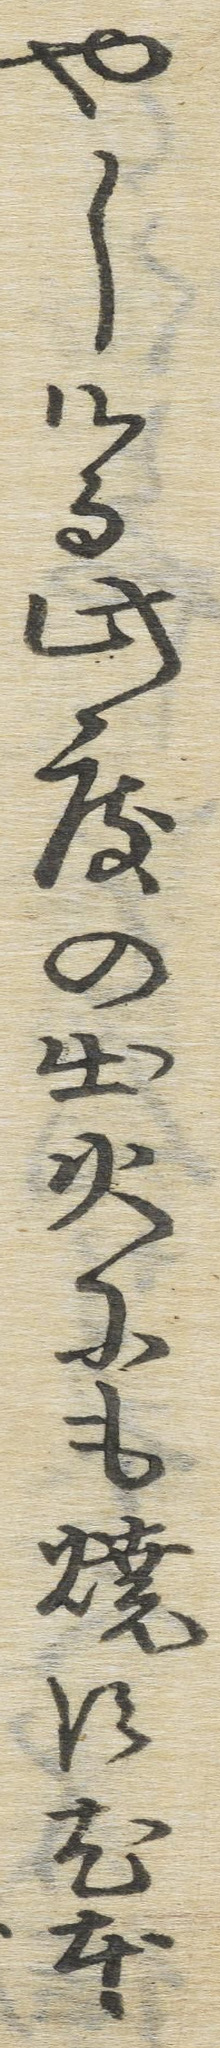やしける此度の出火にも焼す尤本
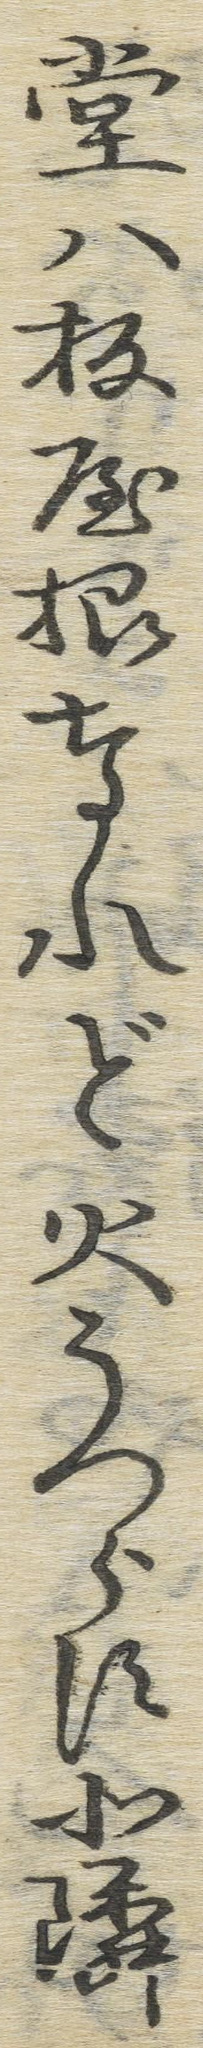堂は板屋根なれど火うつらす北隣
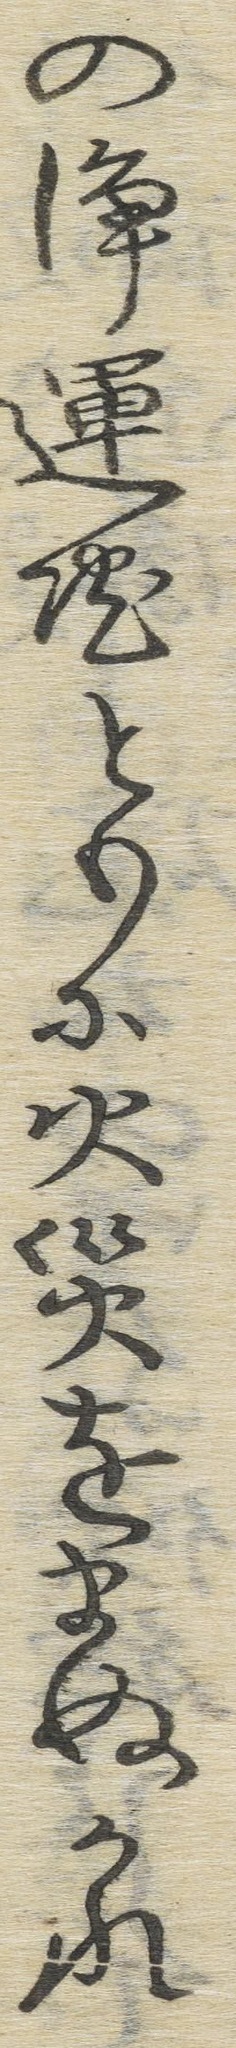の浄運院ともに火災をまぬかれ
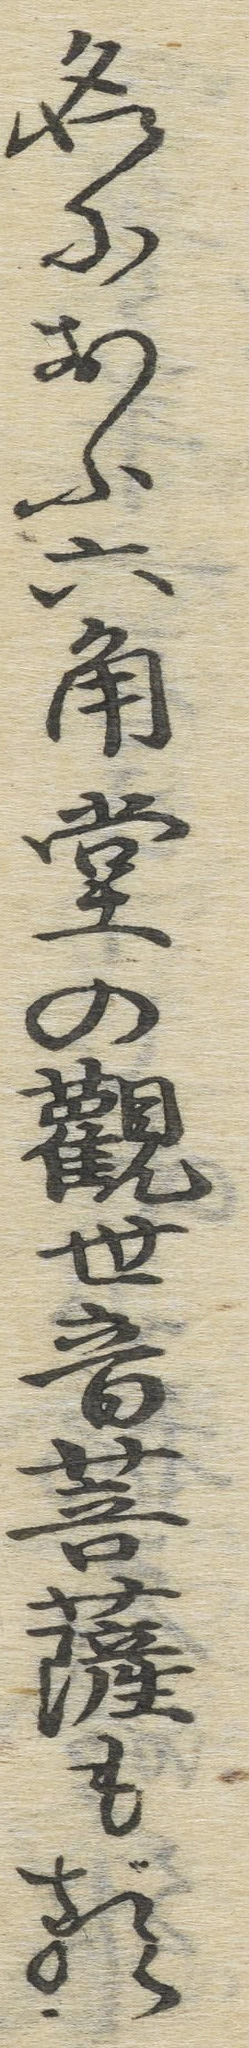名におふ六角堂の観世音菩薩も類
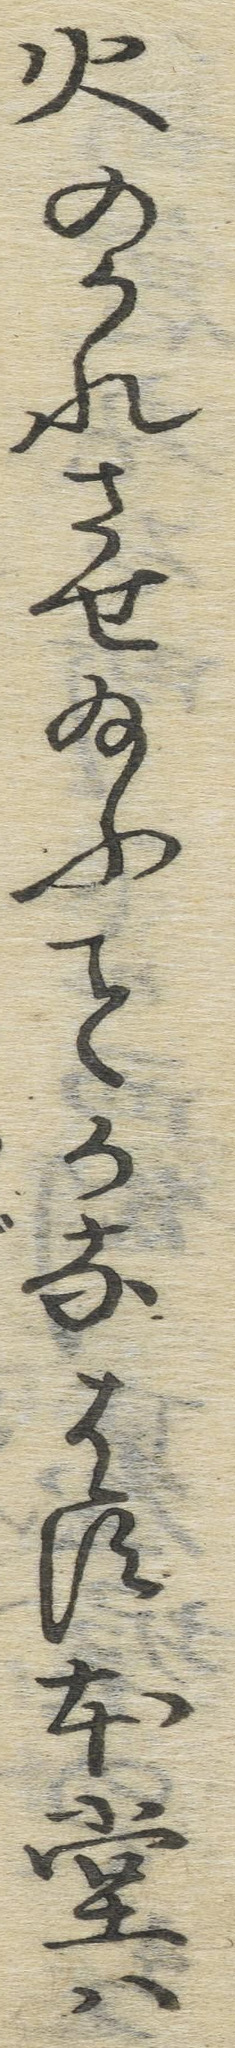火のかれさせ給ふことかなはす本堂は
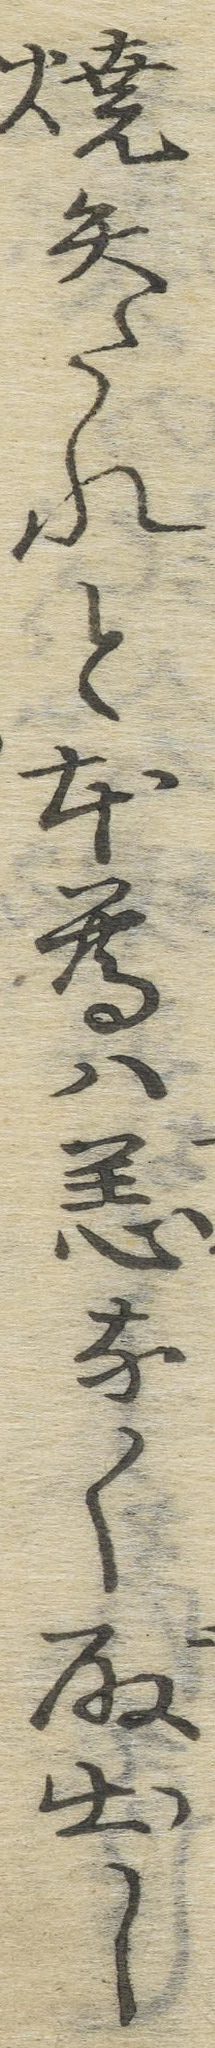焼失たれと本尊は恙なく取出し
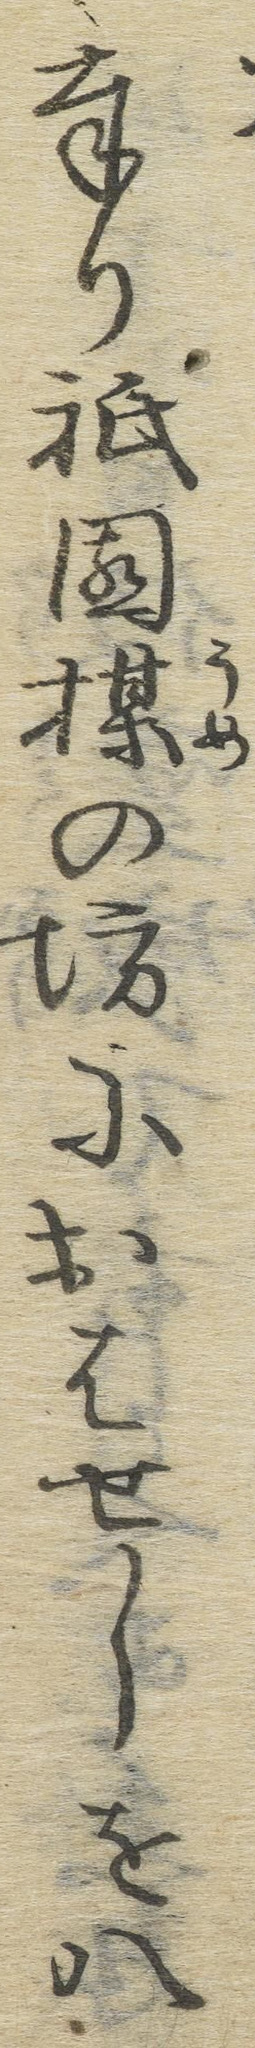奉り祇園楳の坊におはせしを八
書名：あきの日照
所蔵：東京大学地震研究所図書室 Earthquake Research Institute Library, The University of Tokyo, JAPAN
